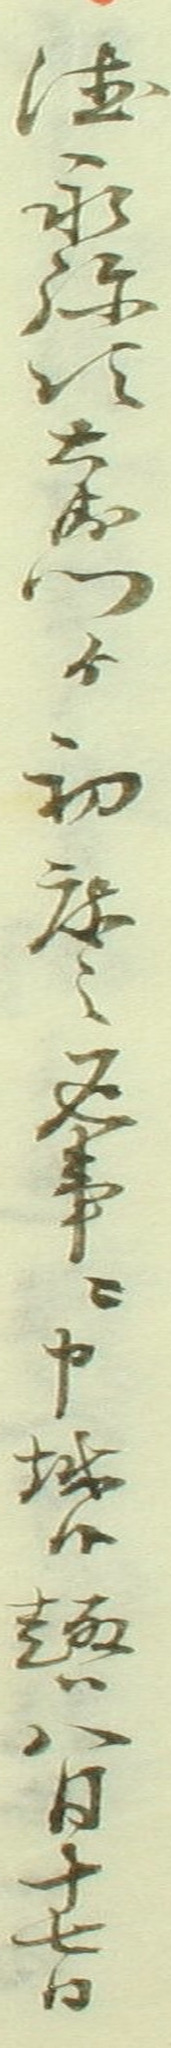徳永弥次右衛門ゟ初度之返事に申越候趣は八月十七日
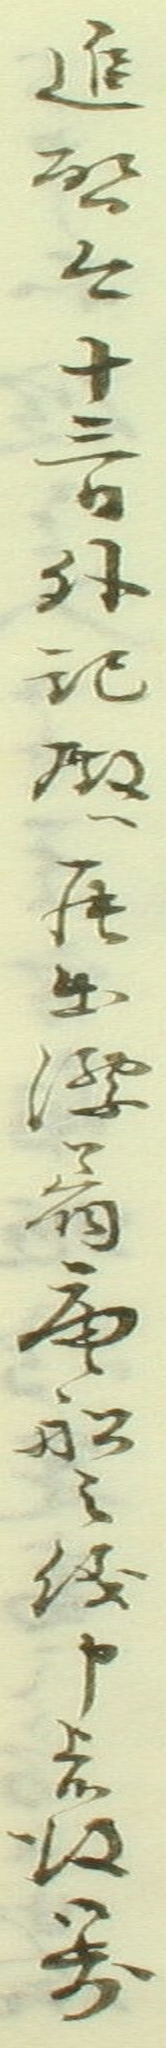追啓今十三日外記殿へ罷出漂着唐船之儀申上候得御歩
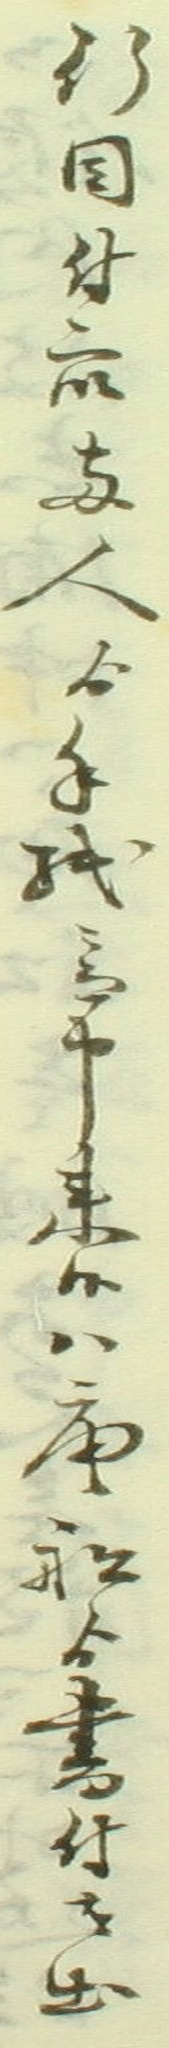行目付衆両人ゟ手紙に而申来候は唐船ゟ書付を出
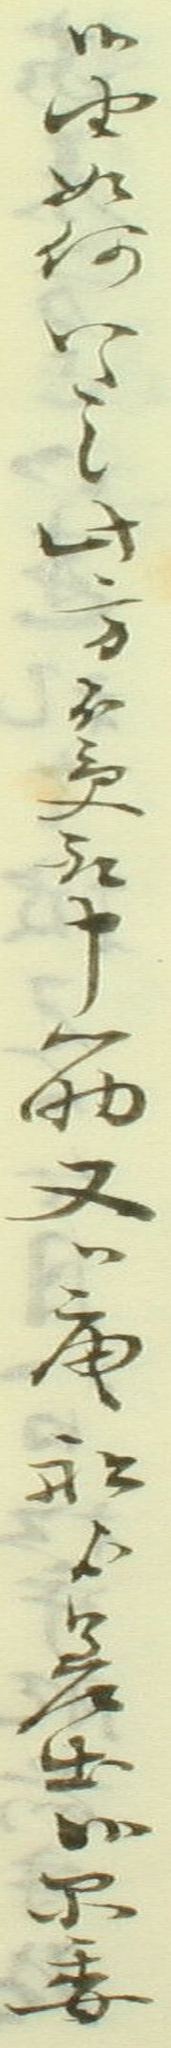候由如何いたし此方ゟ受取申筋又は唐船ゟ差出候品委
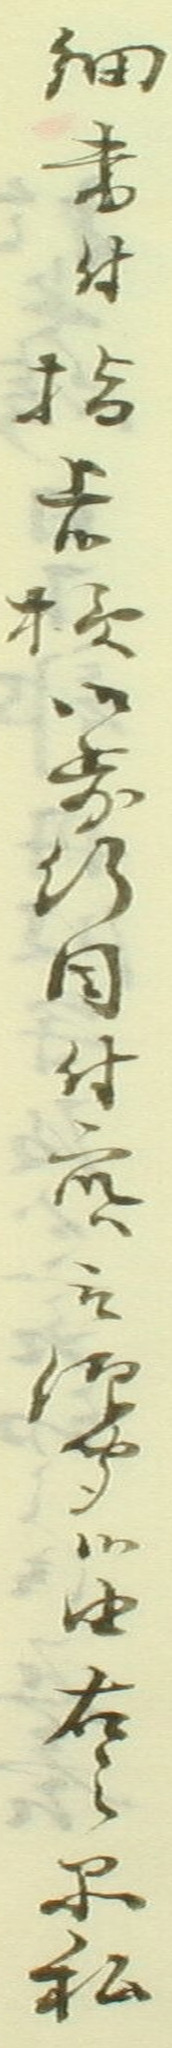細書付指上候様御歩行目付衆は被仰聞候由右之品私
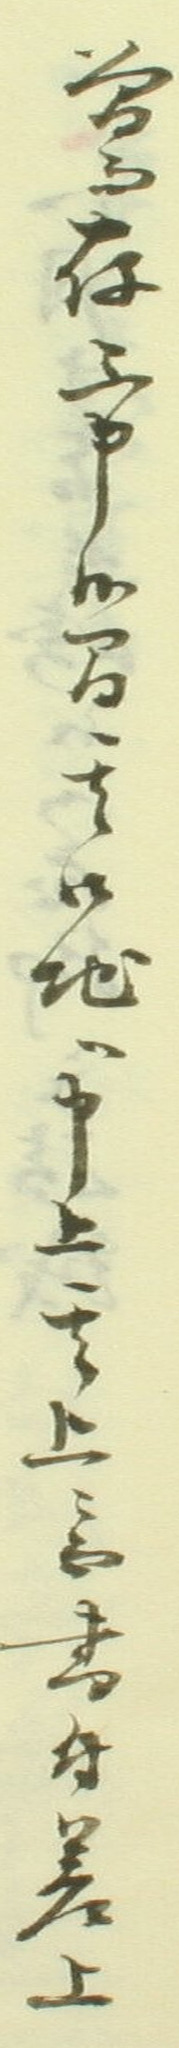曽而存不申候間其御地は申上其上に而書付差上
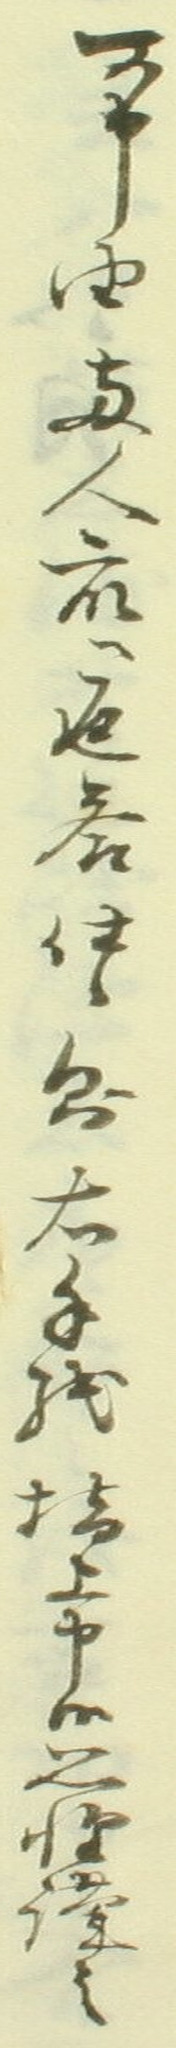可申由両人衆へ返答仕候則右手紙指上申候恐惶謹言
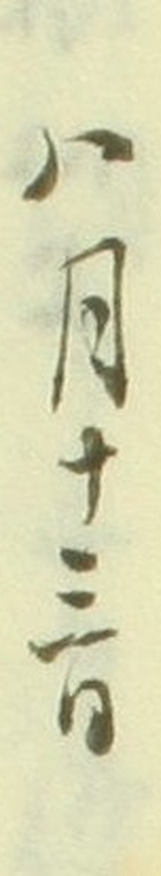八月十三日
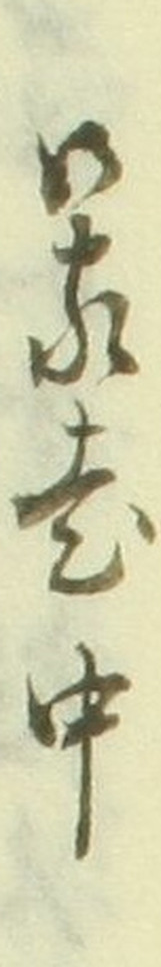御家老中
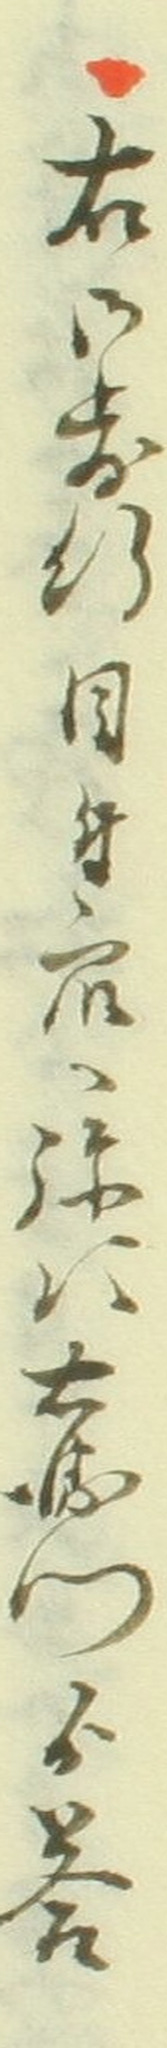右御歩行目付衆へ弥次右衛門ゟ答
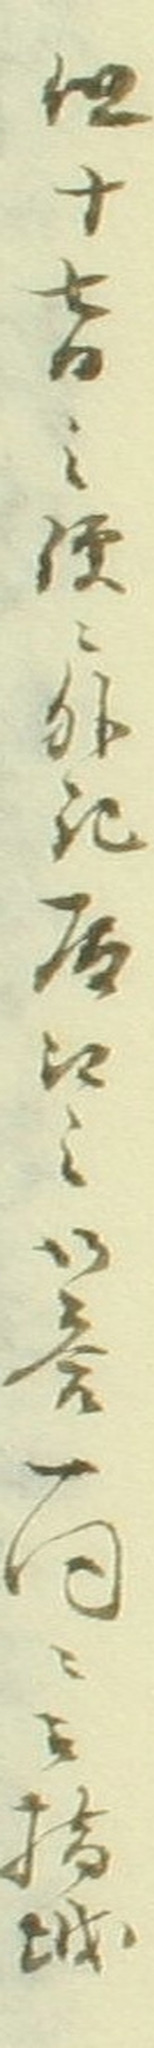但十七日之便に外記殿え之御答一同に被指越
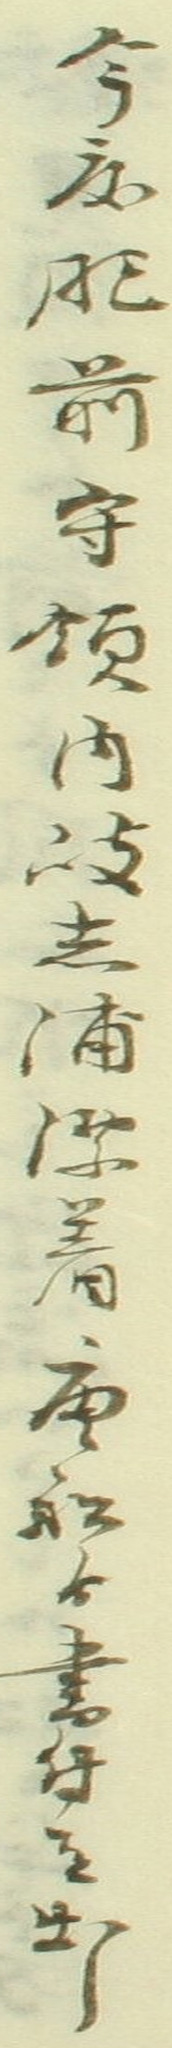今度肥前守領内岐志浦漂着唐船ゟ書付を出し
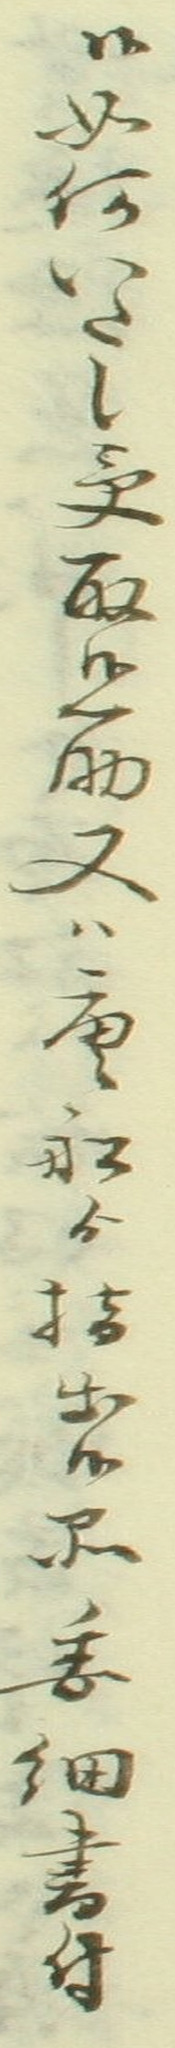候如何いたし受取候筋又は唐船ゟ指出候品委細書付
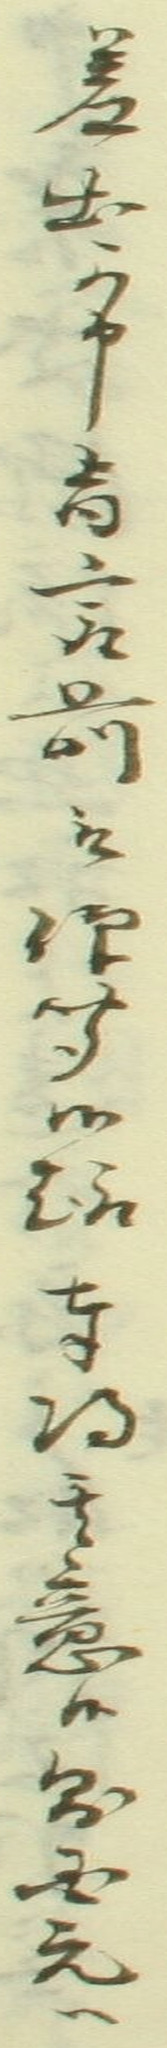差出可申旨最前被仰聞候趣奉得其意候則国元へ

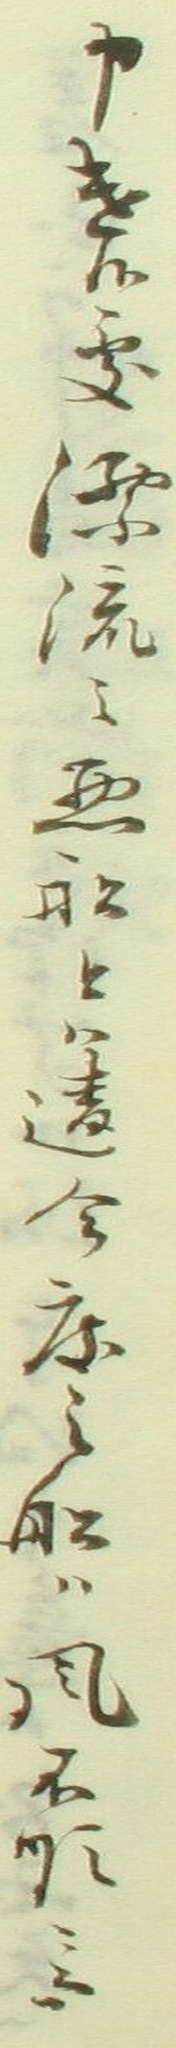申遣候処漂流之悪船とは違今度之船は風不順に而
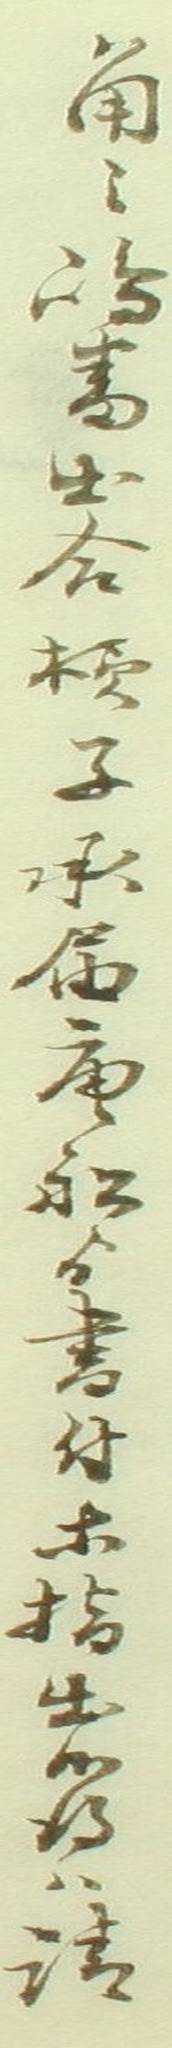角之島番出合様子承届唐船ゟ書付等差出候得が請
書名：異国船漂着記
